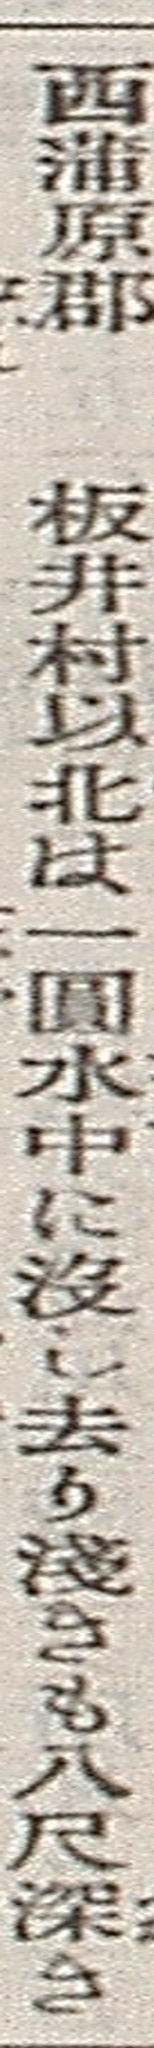西蒲原郡板井村以北は一円水中に没し去り浅きも八尺深き
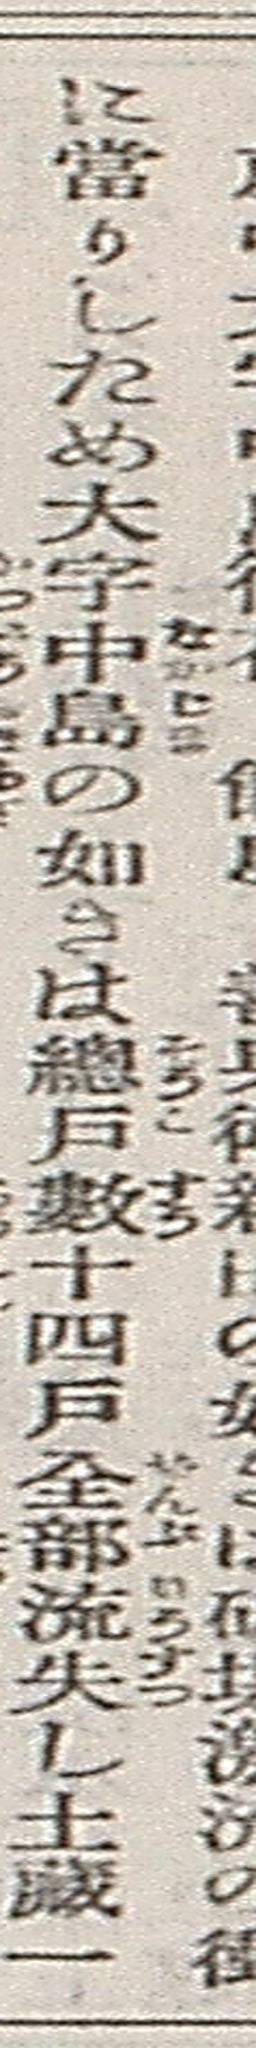に当りしため大字中島の如きは総戸数十四戸全部流失し土蔵一
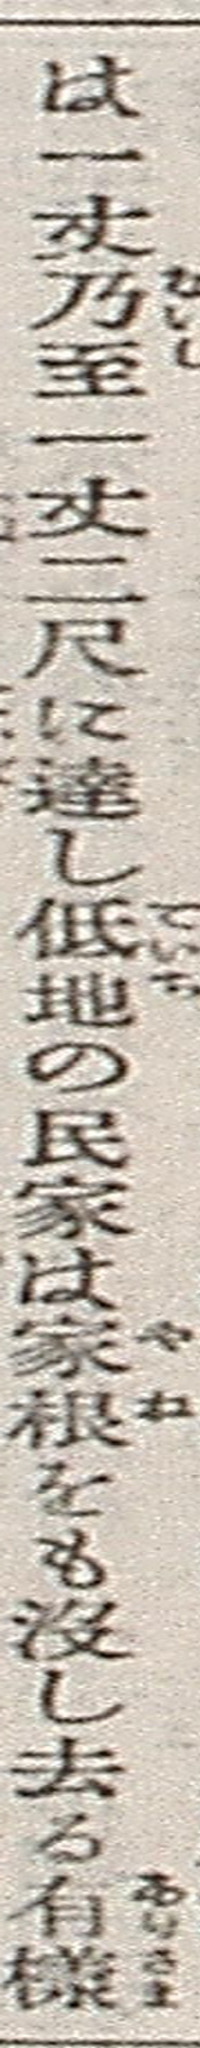は一丈乃至一丈二尺に達し低地の民家は家根をも没し去る有様
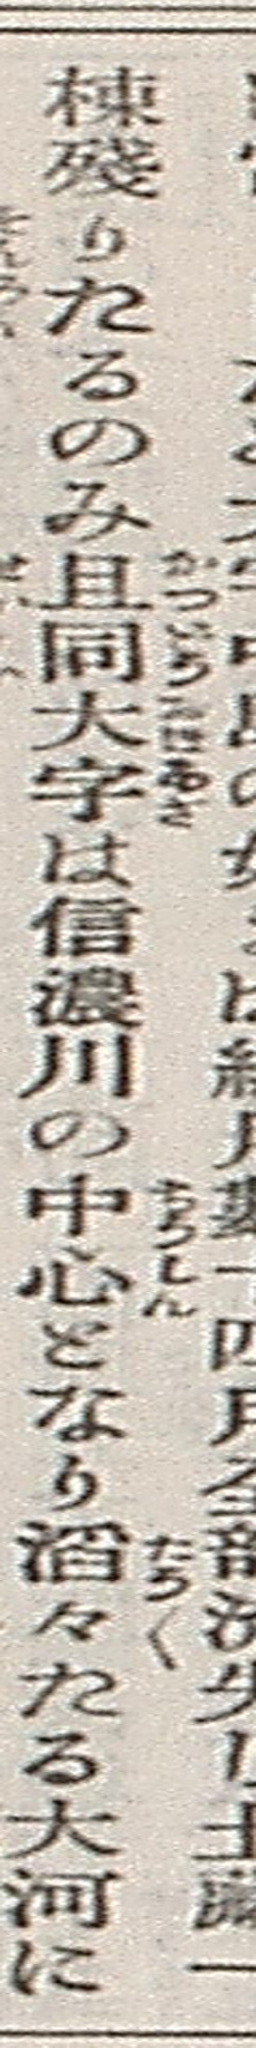棟残りたるのみ且同大字は信濃川の中心となり滔々たる大河に
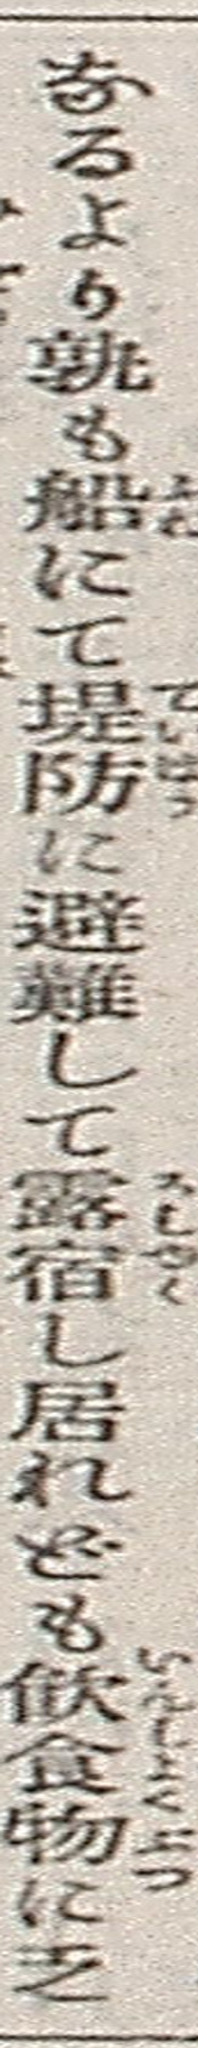なるより孰も船にて堤防に避難して露宿し居れども飲食物に乏
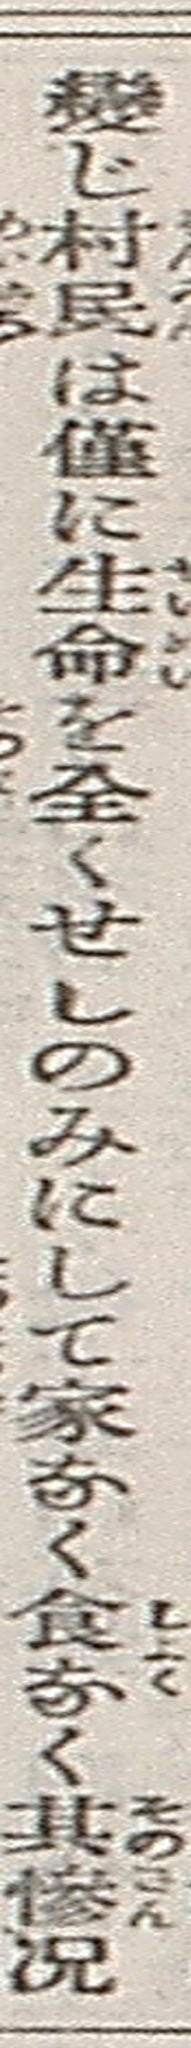変じ村民は僅に生命を全くせしのみにして家なく食なく其惨況
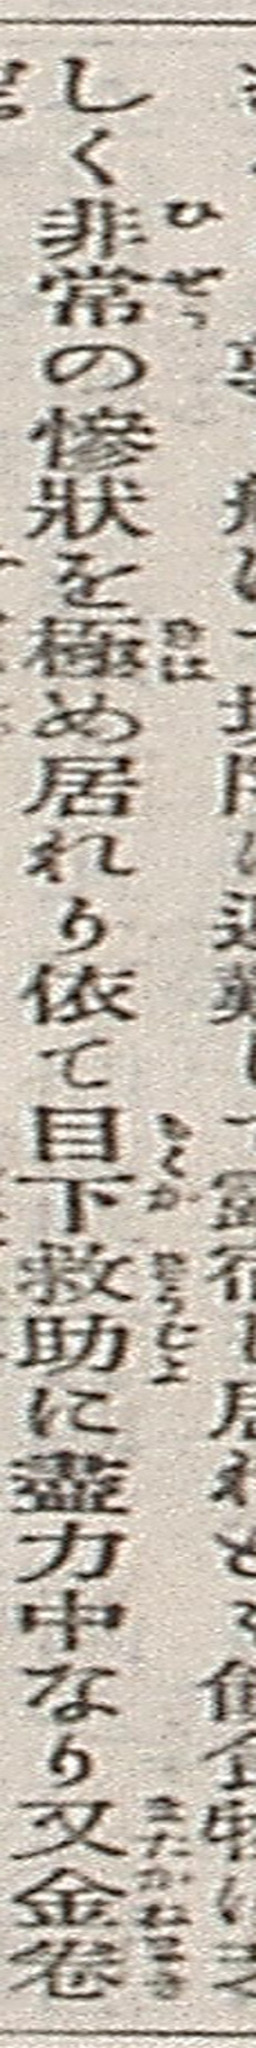しく非常の惨状を極め居れり依て目下救助に尽力中なり又金巻
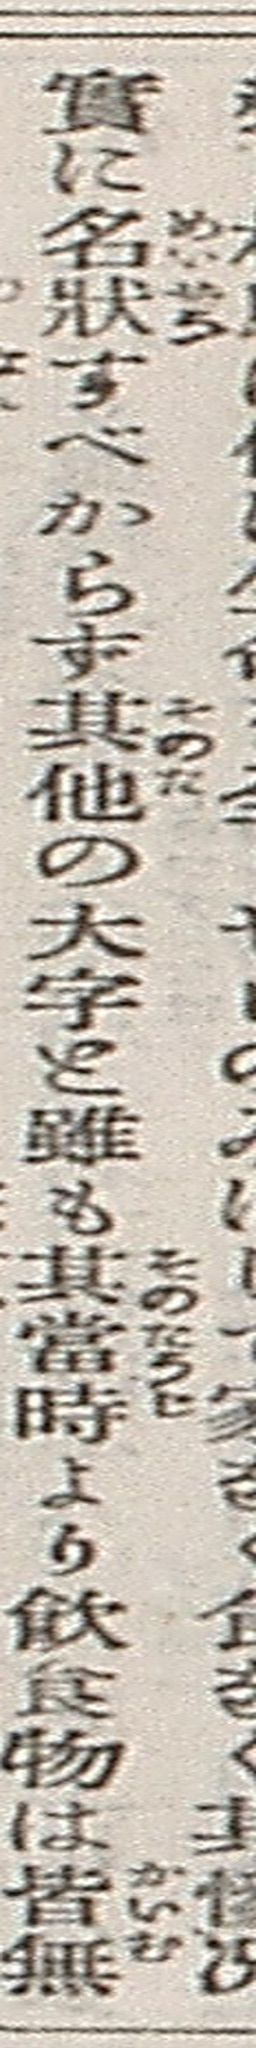実に名状すべからず其他の大字と雖も其当時より飲食物は皆無
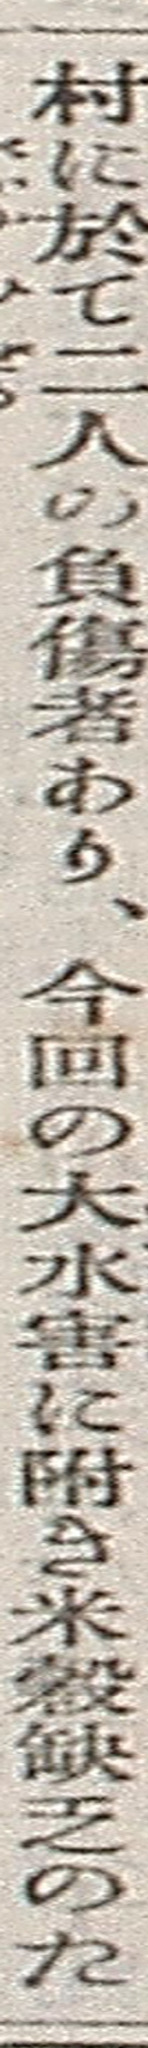村に於て二人の負傷者あり、今回の大水害に附き米穀缺乏のた
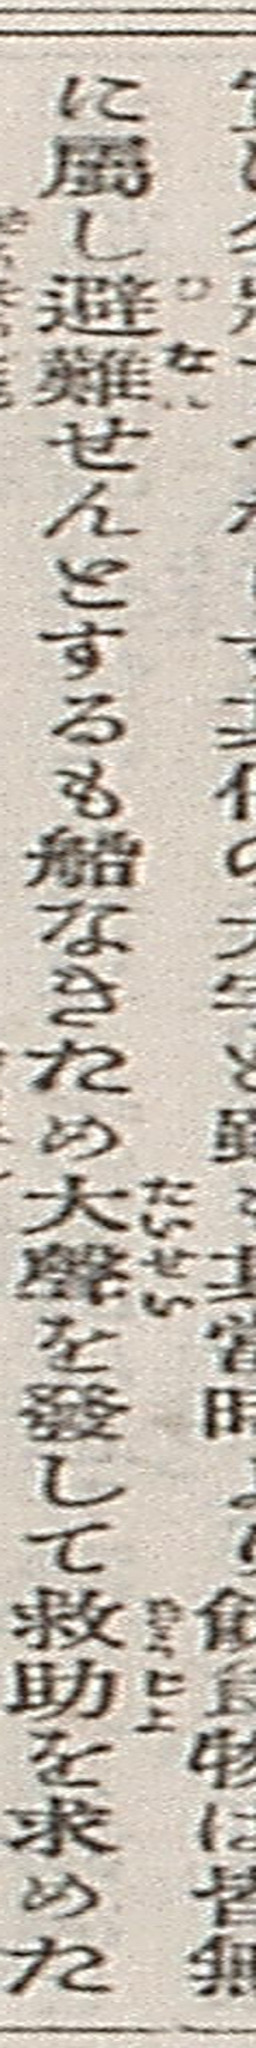に属し避難せんとするも船なきため大声を発して救助を求めた
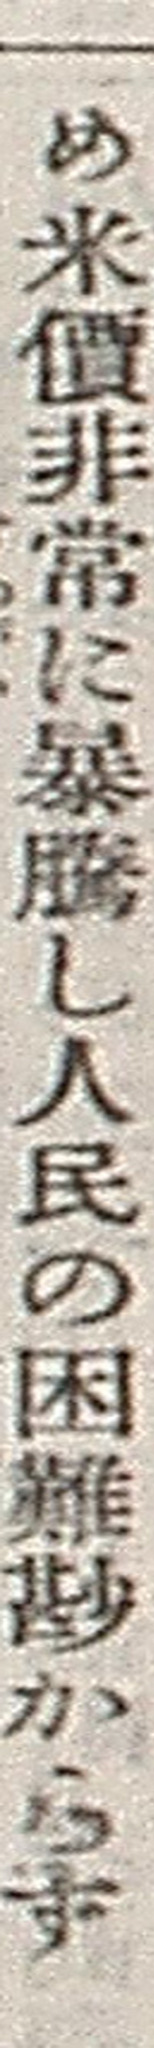め米価非常に暴騰し人民の困難尠からず
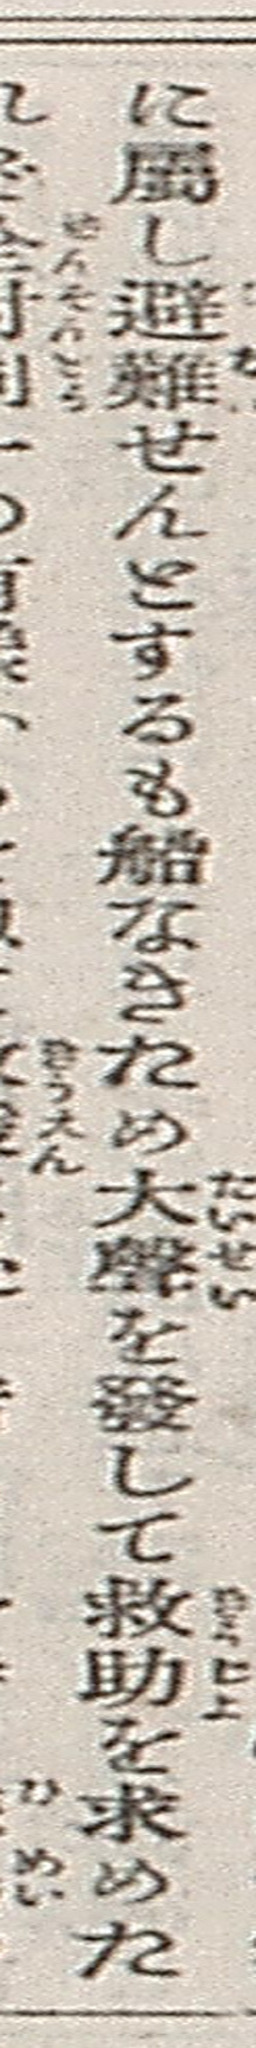に属し避難せんとするも船なきため大声を発して救助を求めた
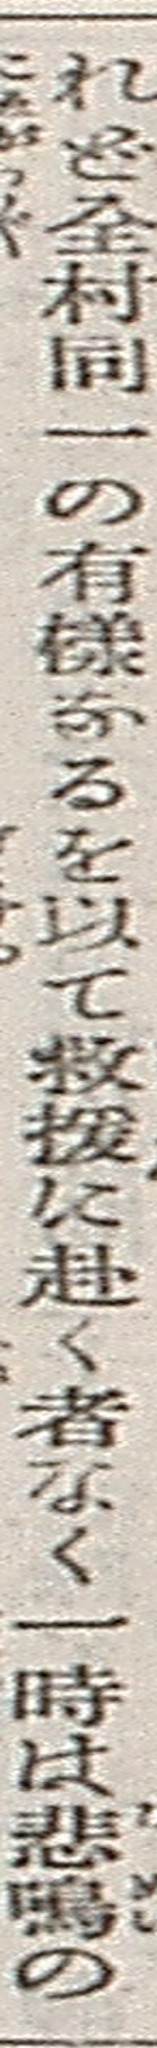れど全村同一の有様なるを以て救援に赴く者なく一時は悲鳴の
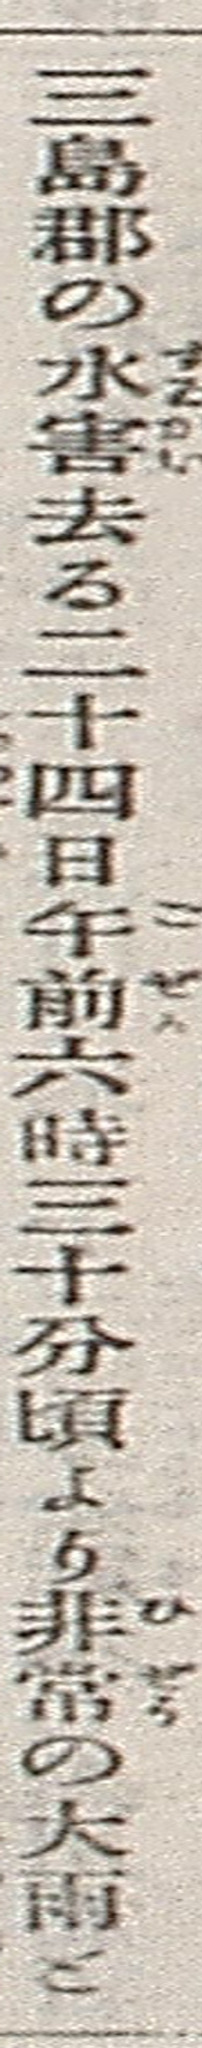三島郡の水害去る二十四日午前六時三十分頃より非常の大雨と
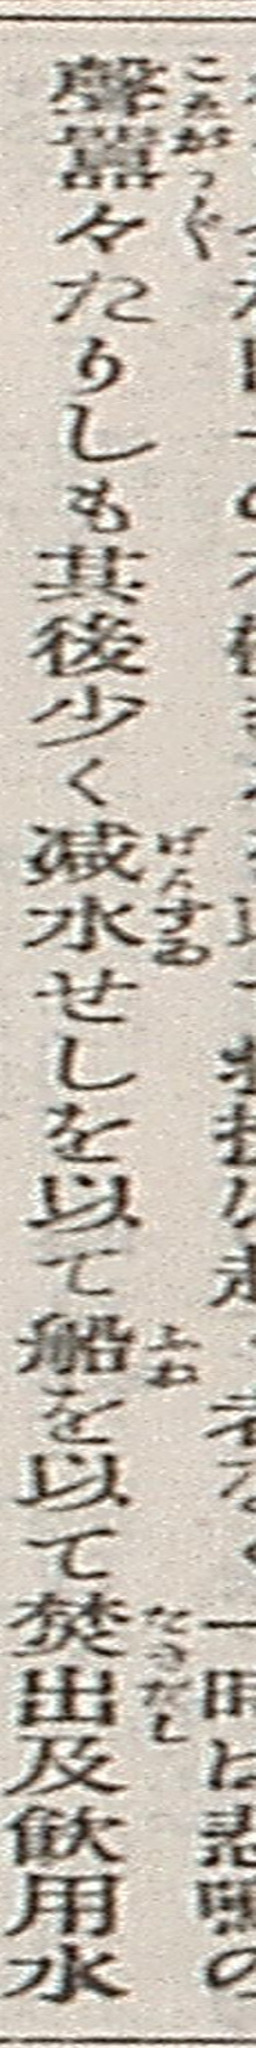声囂々たりしも其後少く減水せしを以て船を以て焚出及飲用水
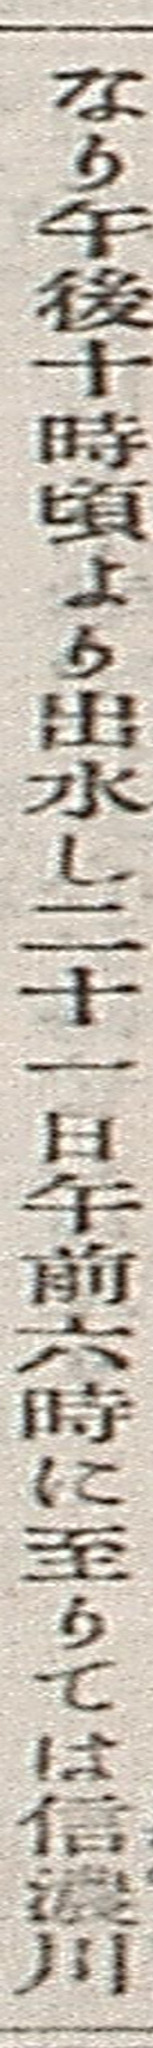なり午後十時頃より出水し二十一日午前六時に至りては信濃川
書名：風俗畫報臨時増刊第百二十八號　洪水被害録（下）
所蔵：東京大学地震研究所図書室 Earthquake Research Institute Library, The University of Tokyo, JAPAN
